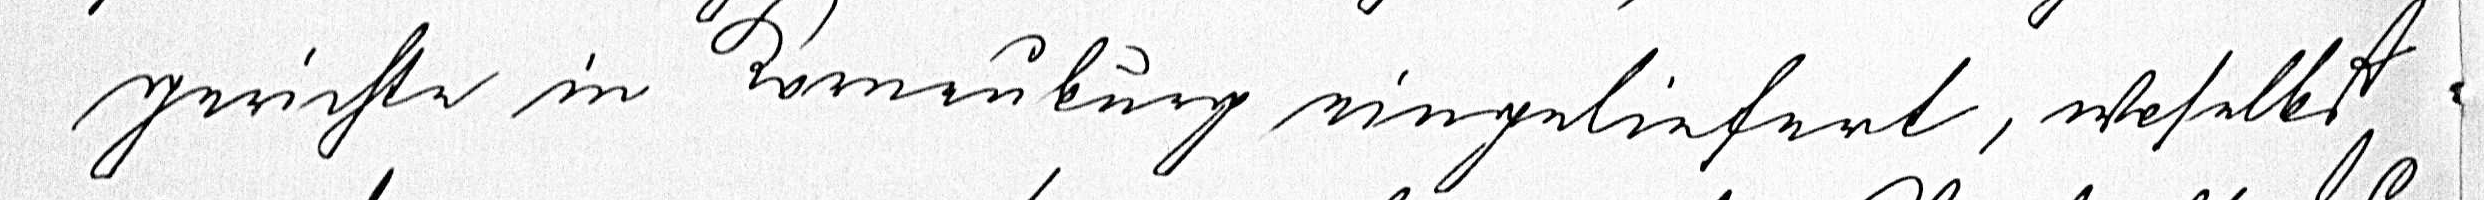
gerichte in Korneuburg eingeliefert, woselbst
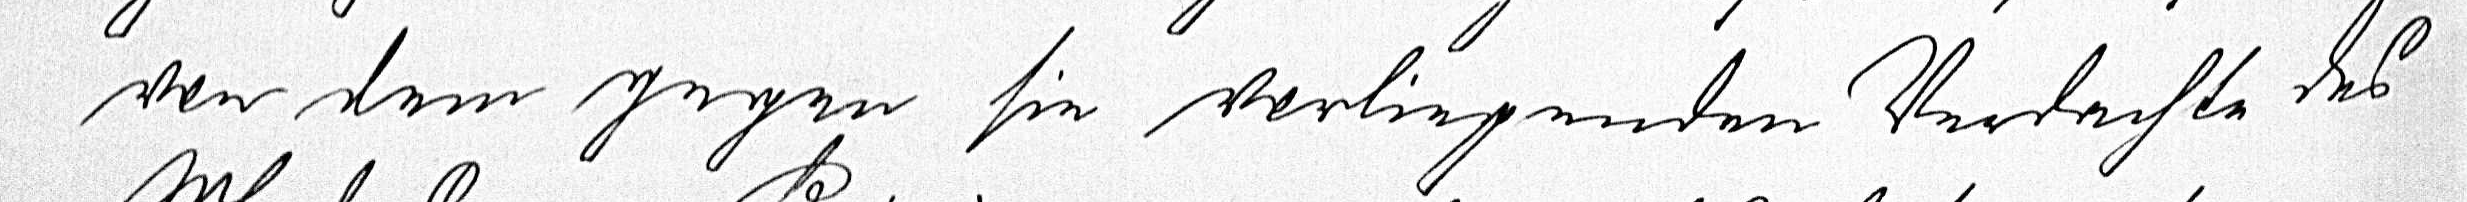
von dem gegen sie vorliegenden Verdachte des
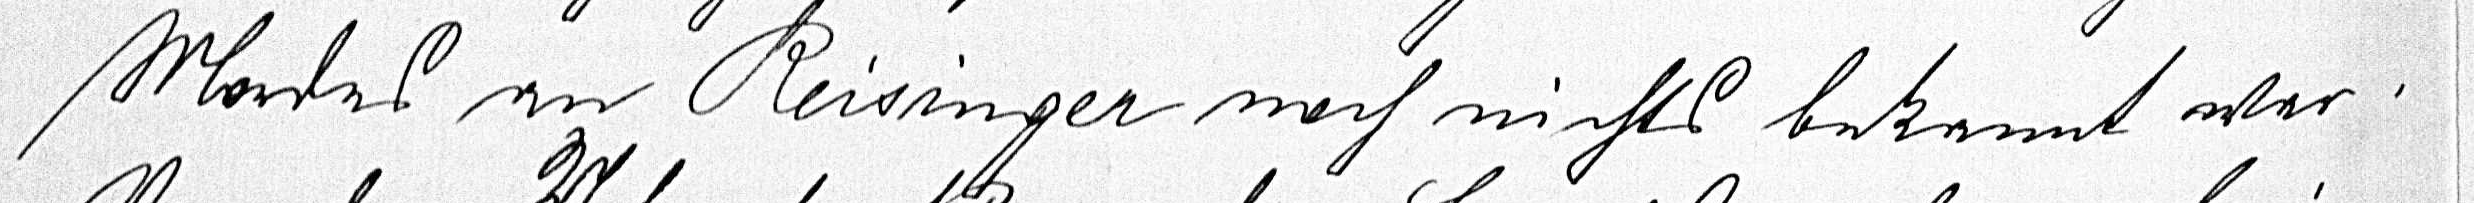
Mordes an Reisinger noch nichts bekannt war.
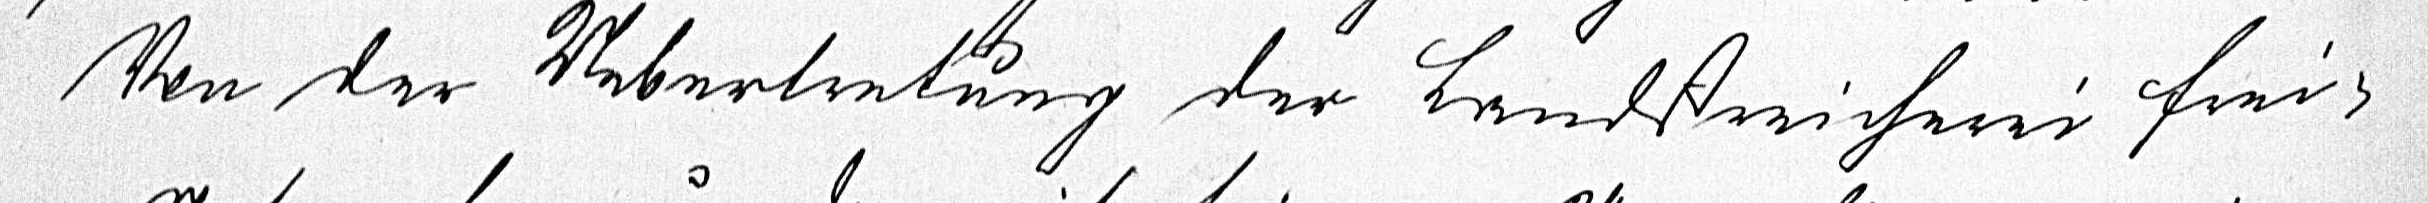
Von der Uebertretung der Landstreicherei frei¬
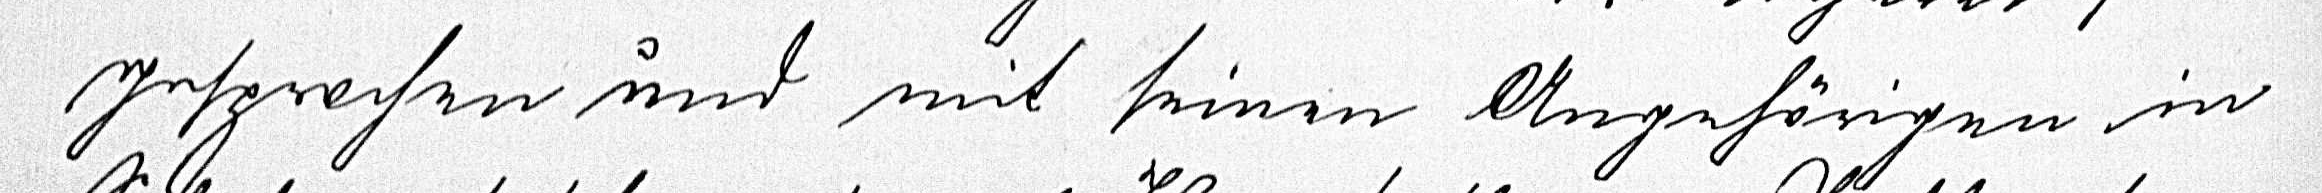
gesprochen und mit seinen Angehörigen in
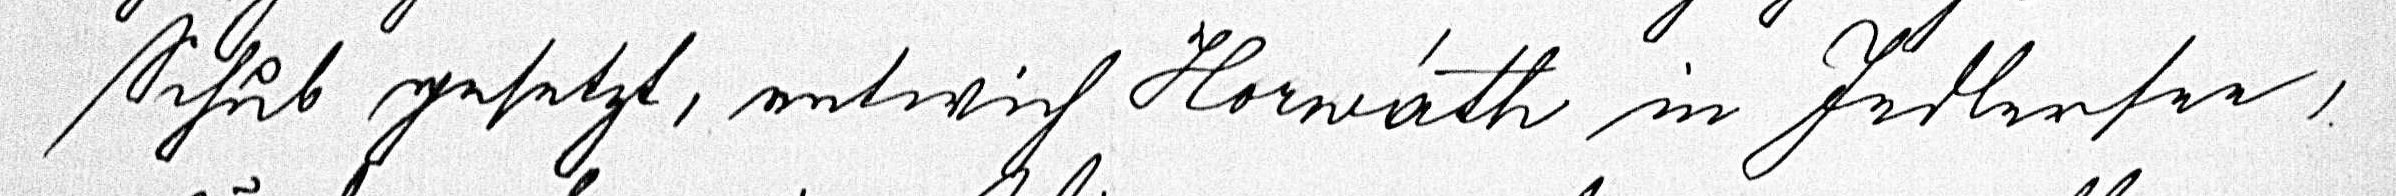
Schub gesetzt, entwich Horwáth in Jedlersee,
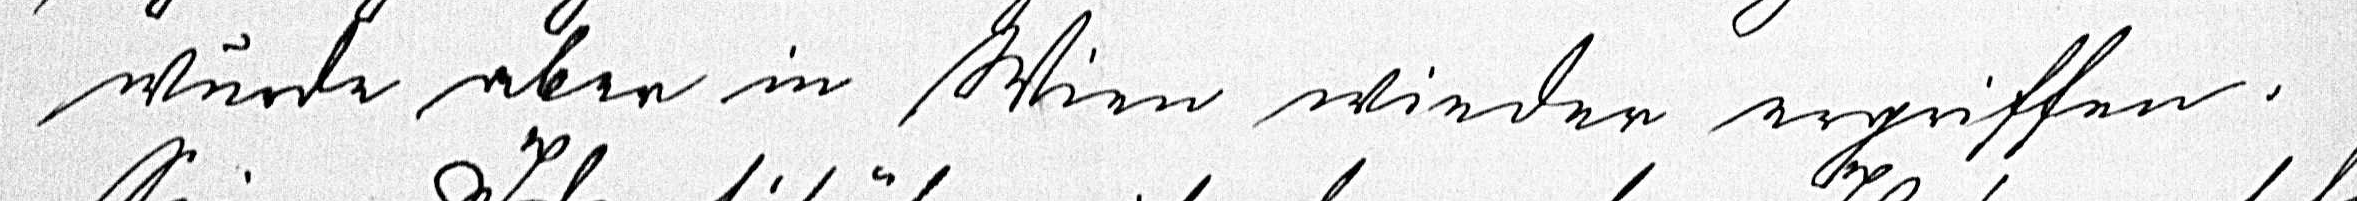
wurde aber in Wien wieder ergriffen.
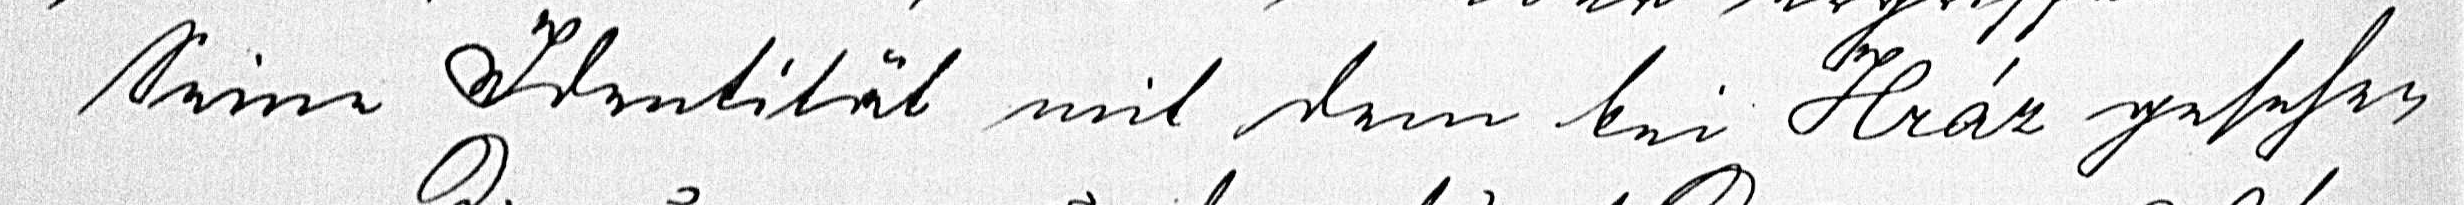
Seine Identität mit dem bei Hráz gesehe¬
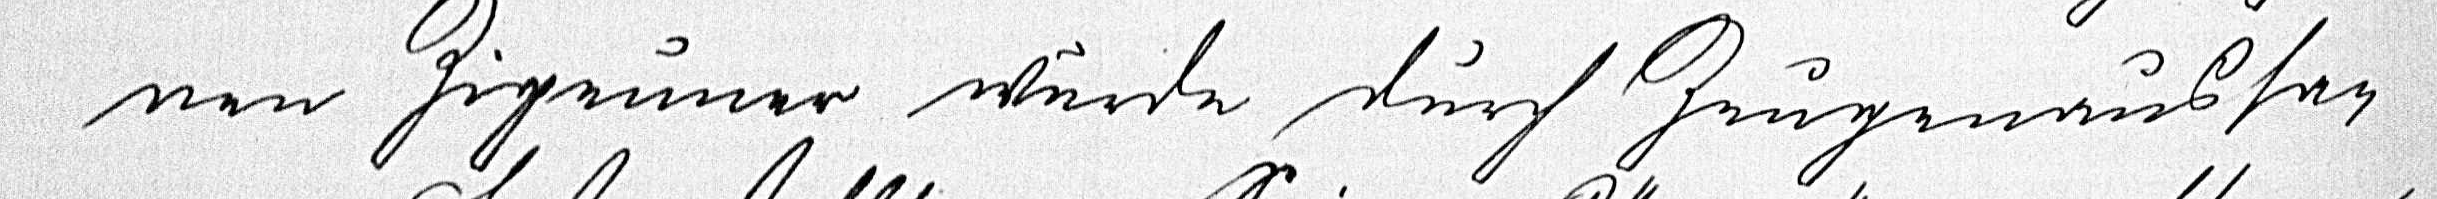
nen Zigeuner wurde durch Zeugenaussa¬
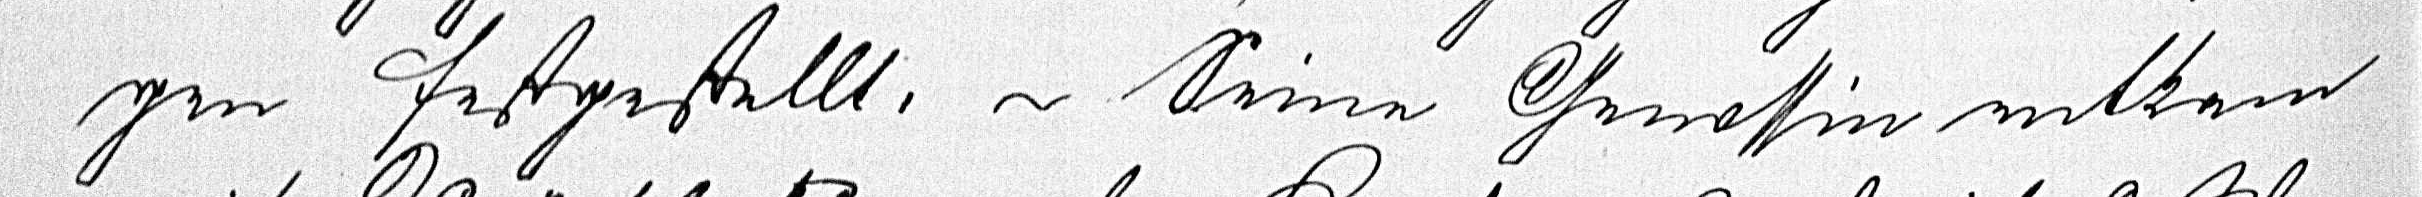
gen festgestellt. Seine Genossin entkam
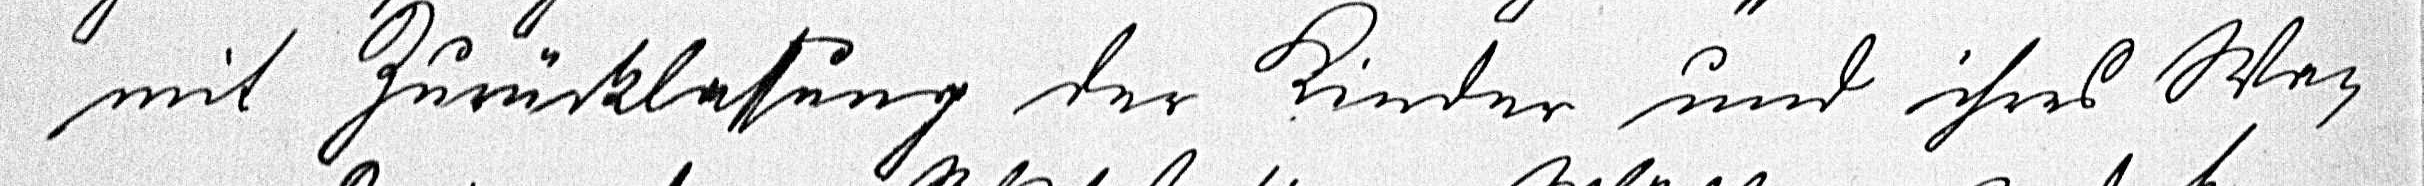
mit Zurücklassung der Kinder und ihres Wa¬
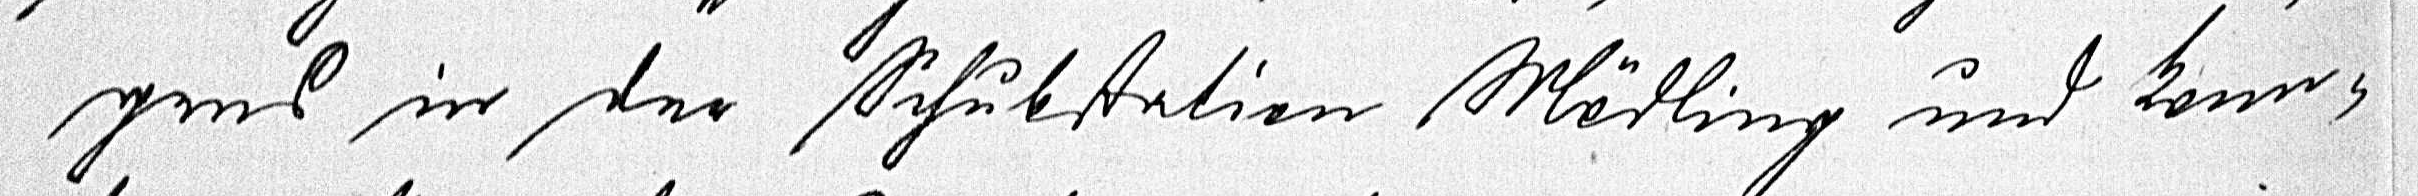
gens in der Schubstation Mödling und konn¬
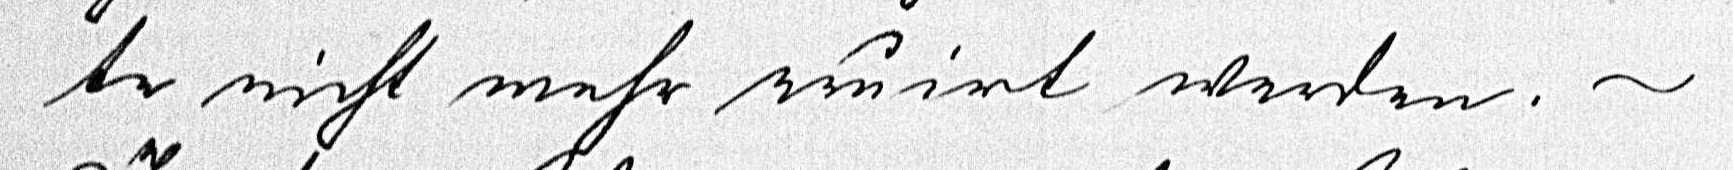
te nicht mehr eruirt werden.
